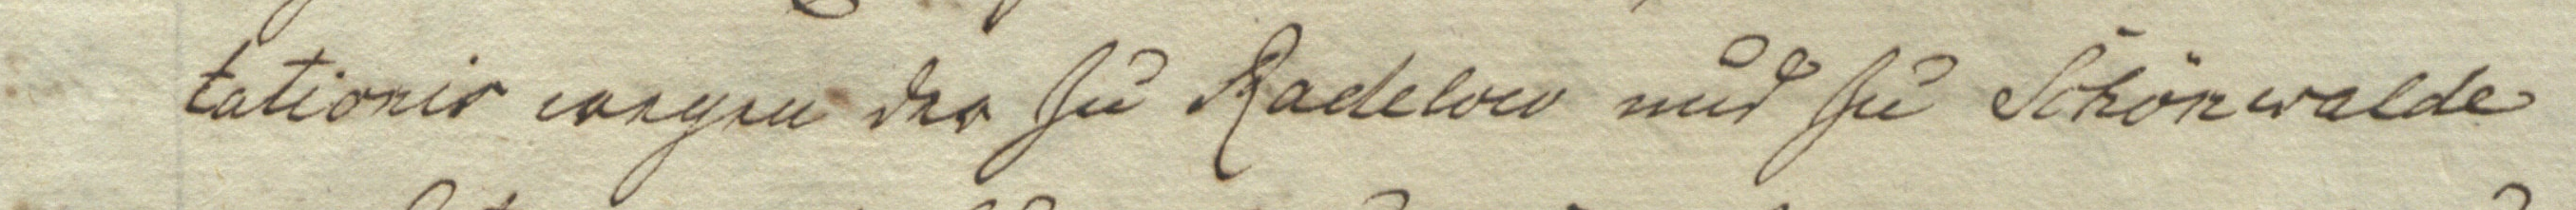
tationis wegen der zu Radelow und zu Schönwalde
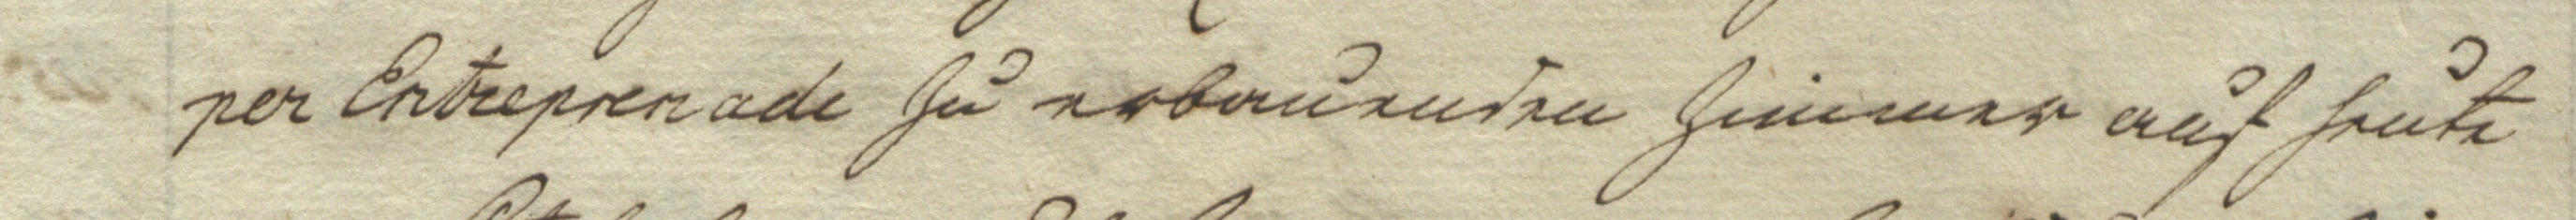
per Entreprenade zu erbauenden Zimmer auf heute
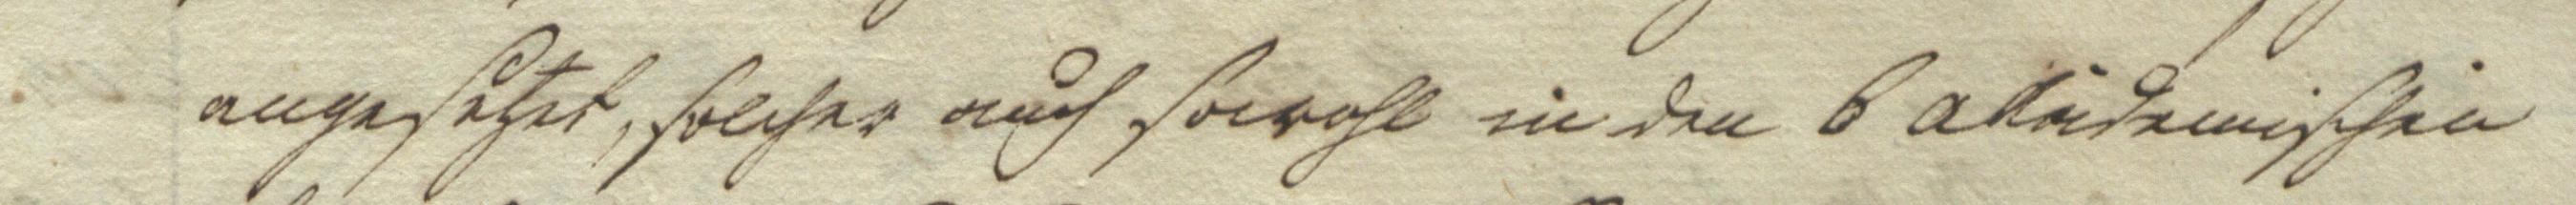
angesetzet, solche auch sowohl in den 6 akademischen
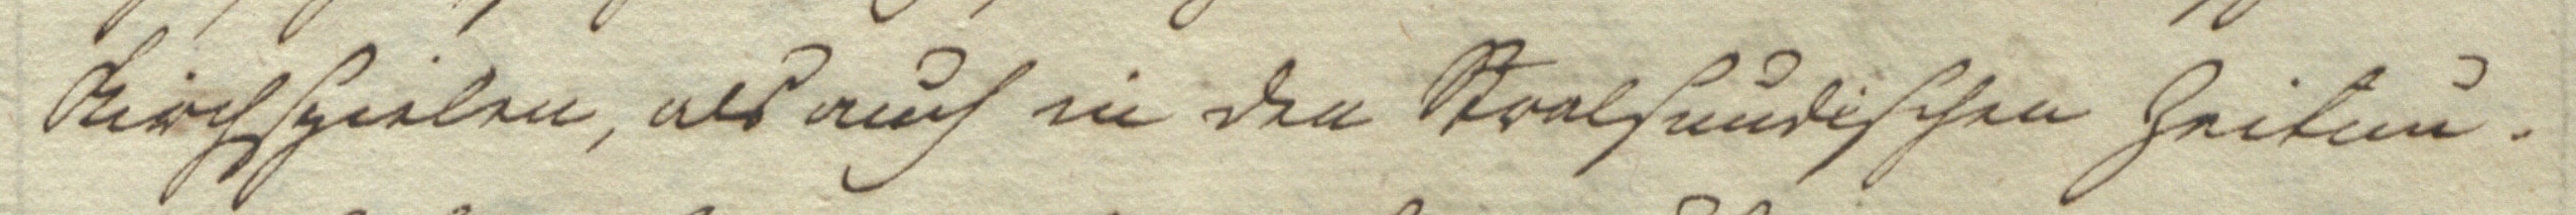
Kirchspielen, als auch in den Stralsundischen Zeitun¬
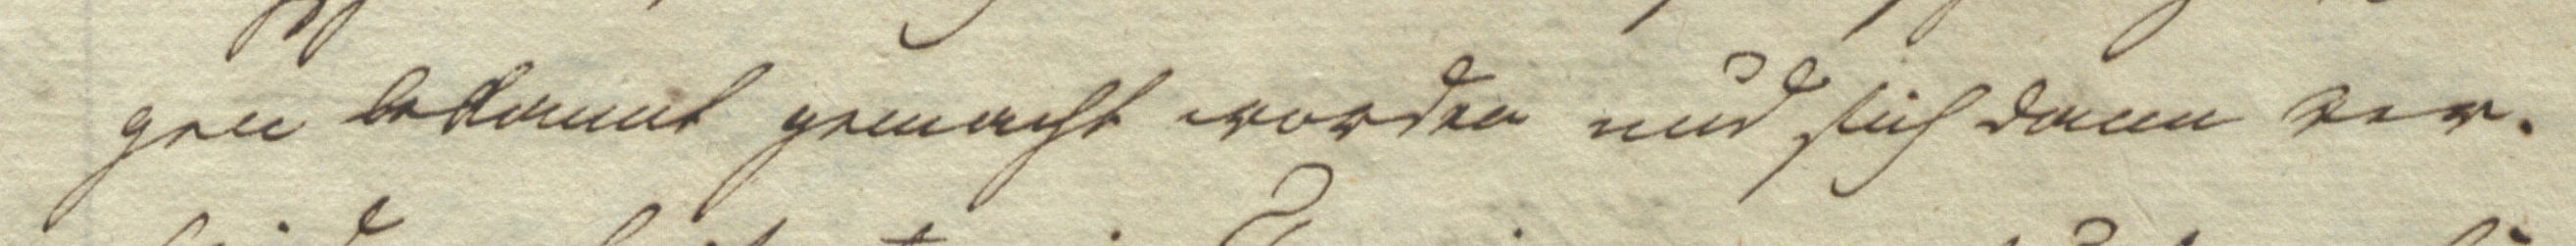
gen bekannt gemacht worden und sich dann ver¬
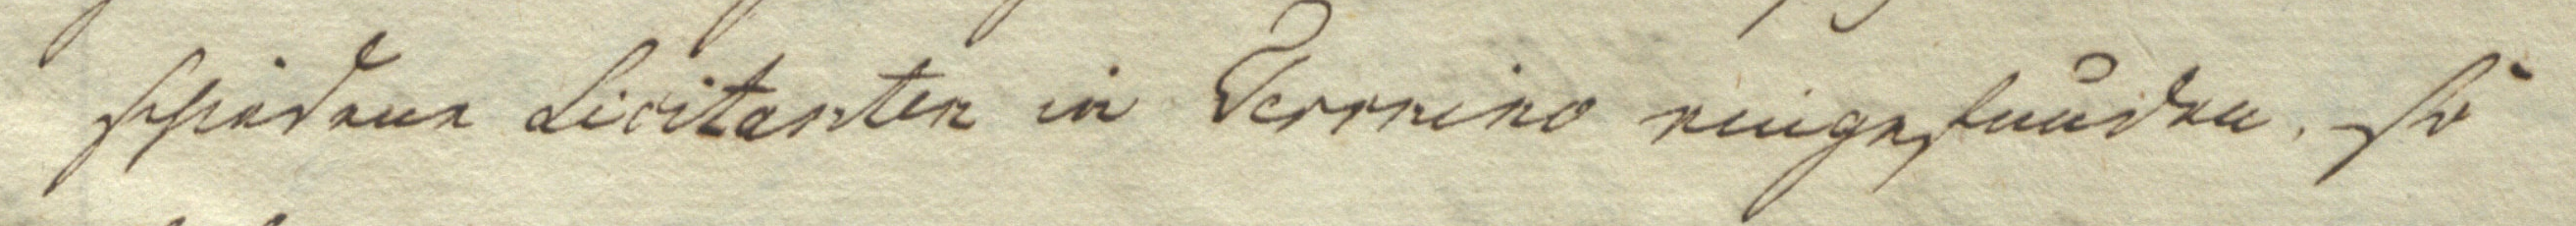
schiedene Licitanten in Termino eingefunden, so
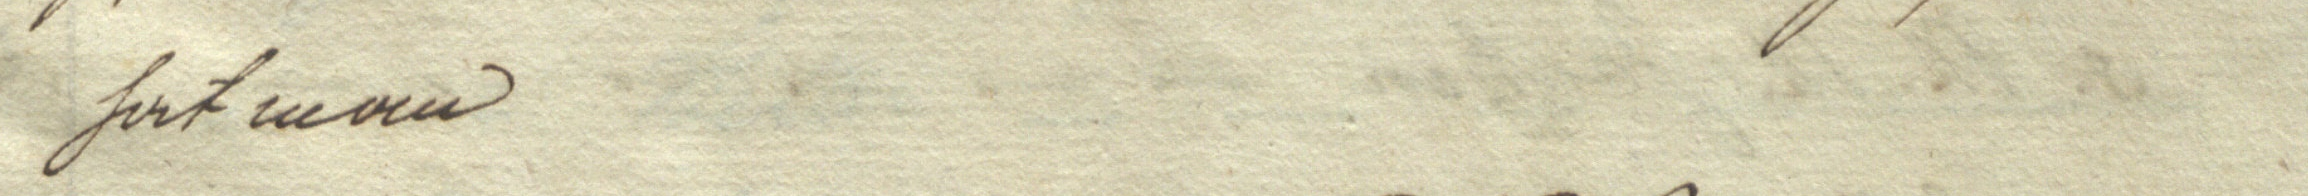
hat man
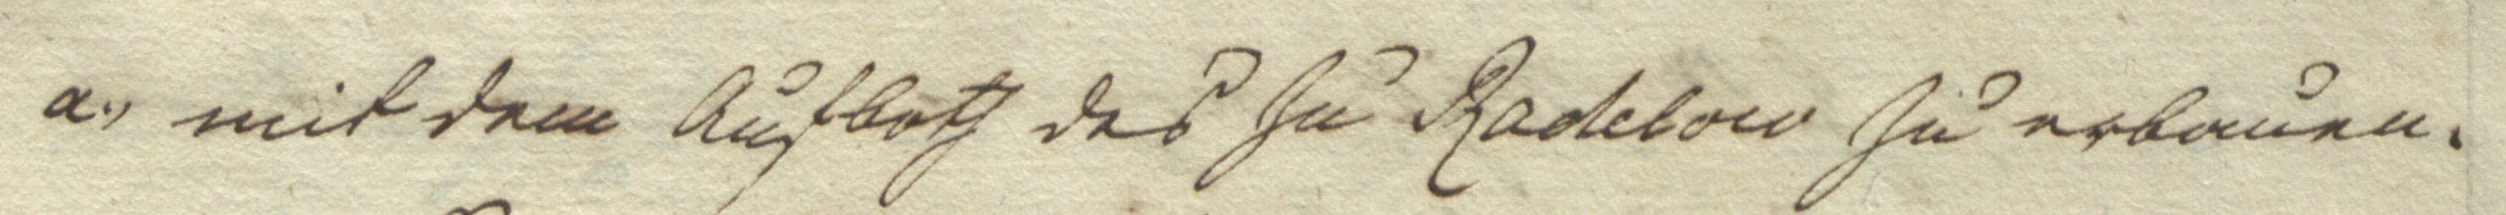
a., mit dem Aufboth des zu Radelow zu erbauen¬
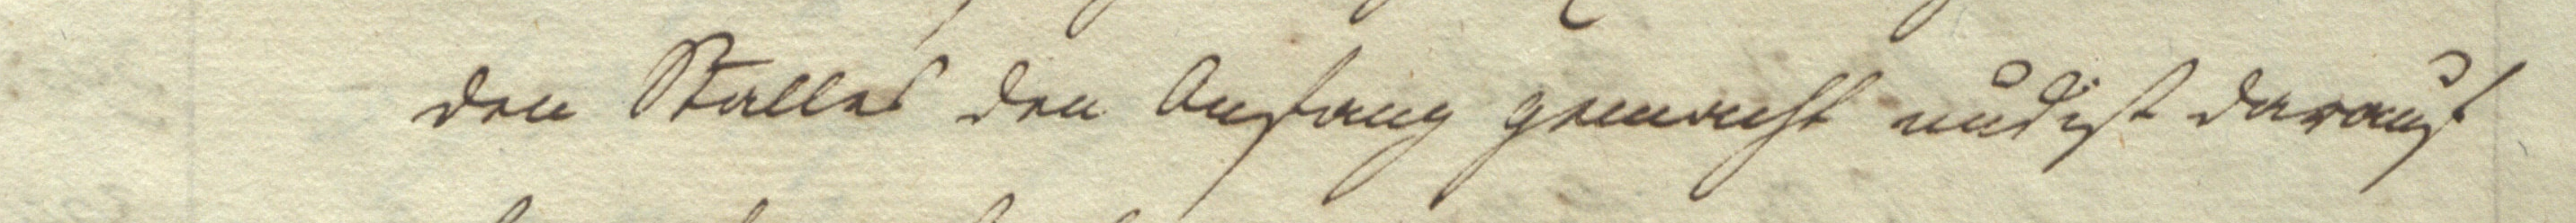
den Stalles den Anfang gemacht und ist darauf
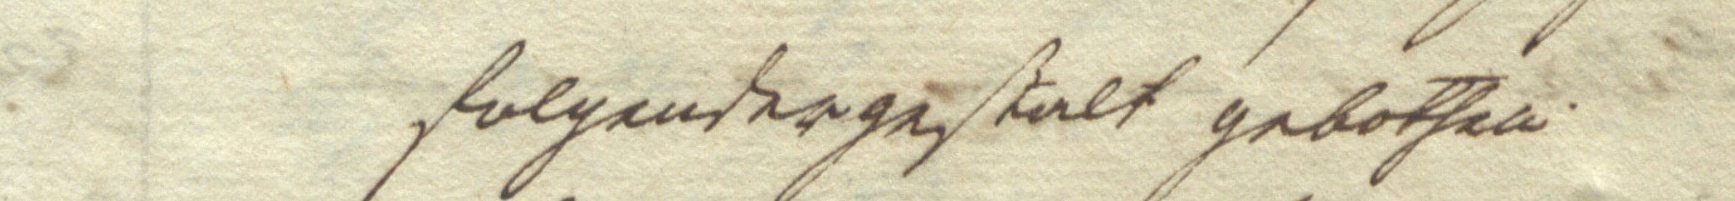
folgendergestalt gebothen
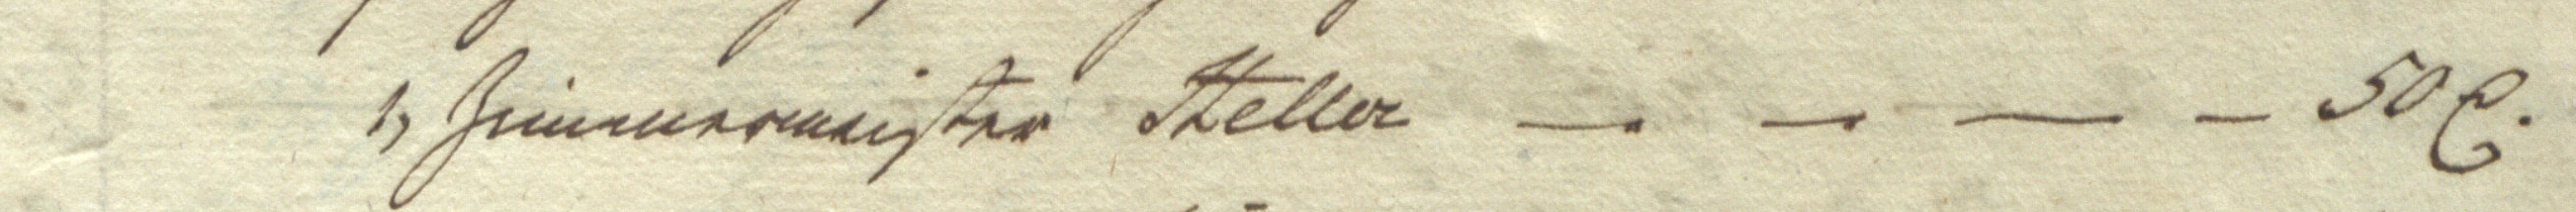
1, Zimmermeister Heller ————50rtl.
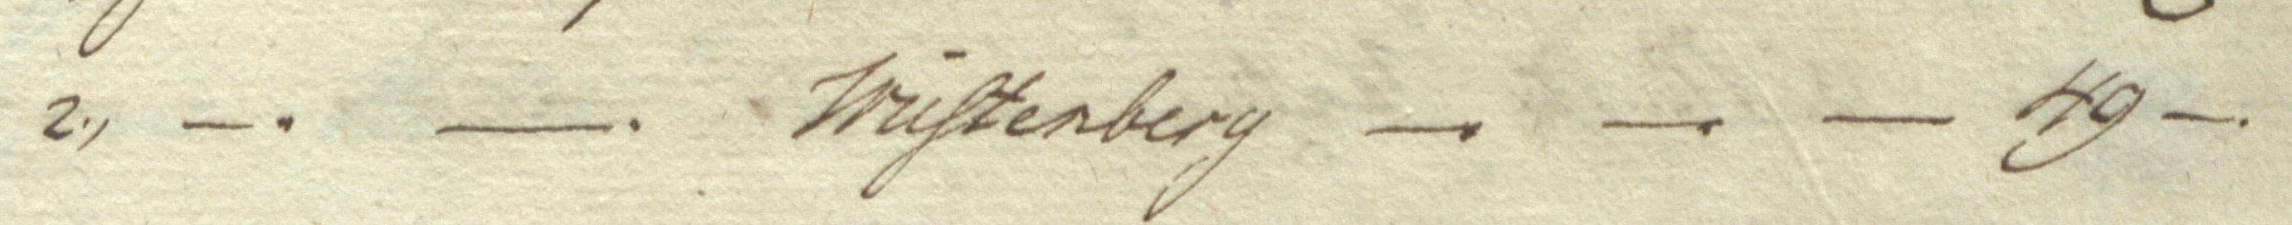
2., - " - " Wüstenberg - "- " - 49 -
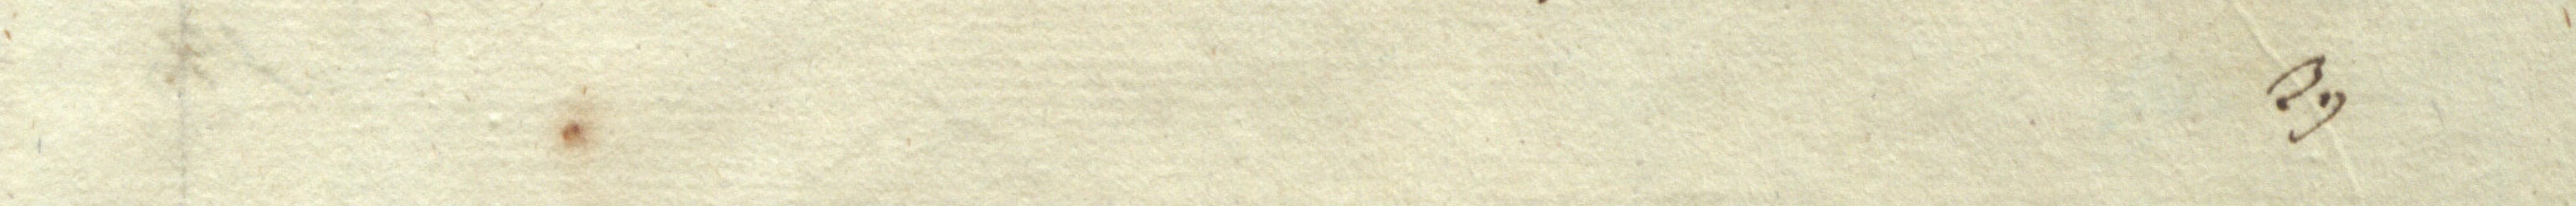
3.,
